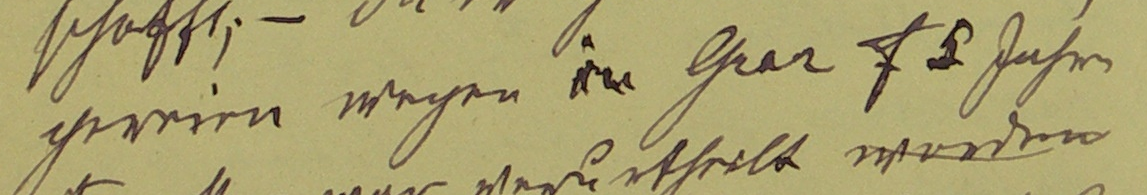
gereien wegen in Graz ??? 5 Jahre
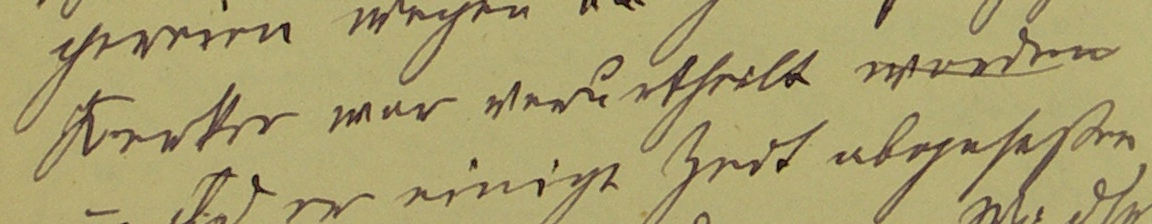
Kerker war verurtheilt worden
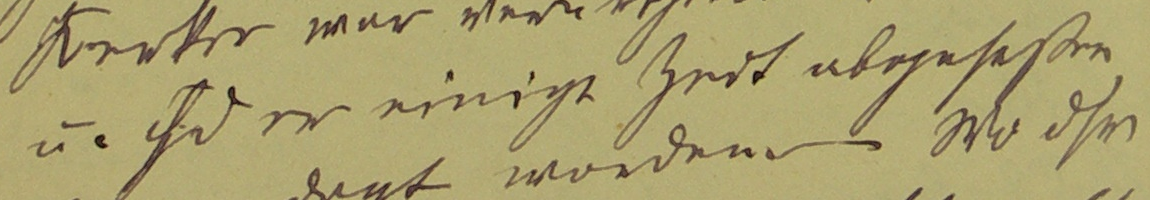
u. ??? er einige Zeit abgeseßen,
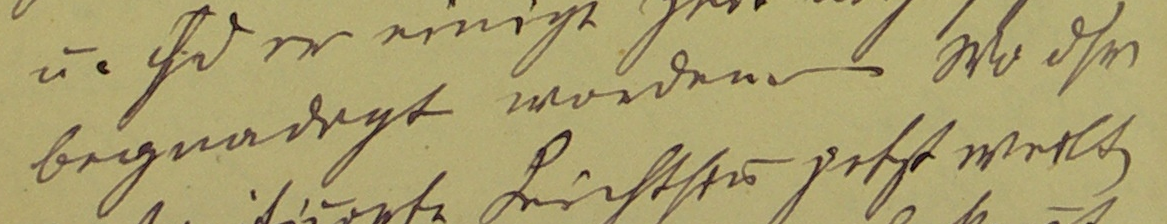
begnadigt worden . Wo dser
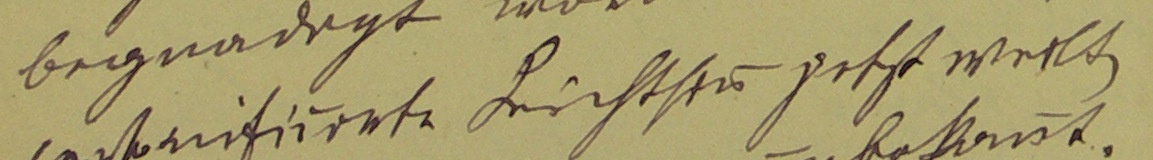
??? Leichtsin jetzt weilt.
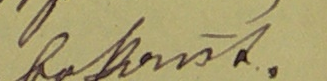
???kannt.
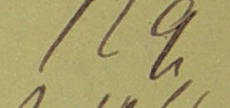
129
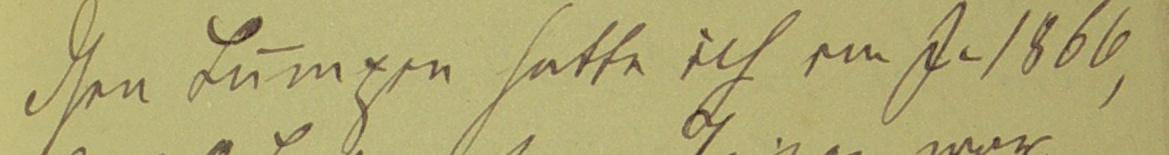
Dsen Lumpen hatte ich im J.1866,
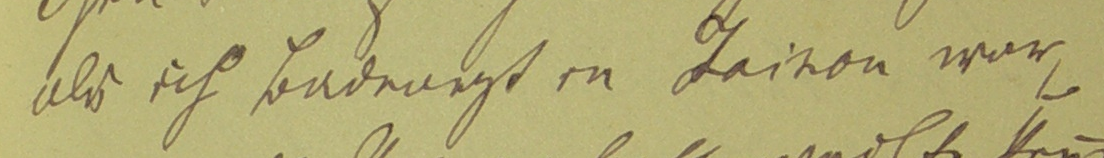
als ich Badearzt in Zaizon war,
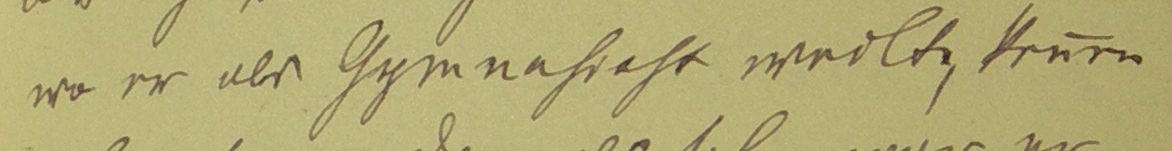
wo er als Gymnasiast weilte, kenen
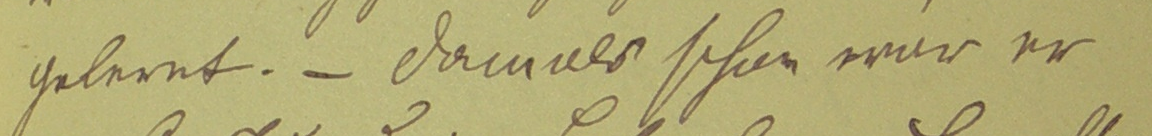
gelernt. - Damals schon war er ein
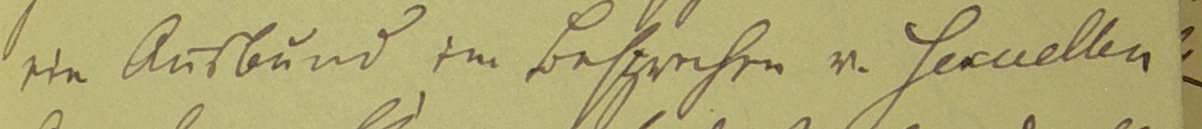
Ausbund im Besprechen v. sexuellen
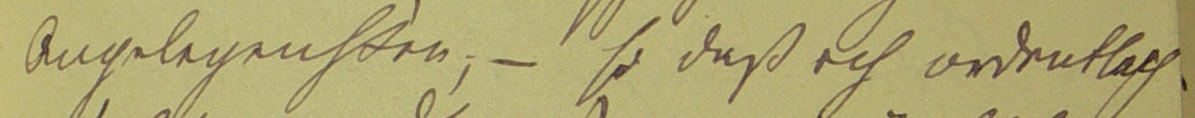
Angelegenheiten; - so daß ich ordentlich
